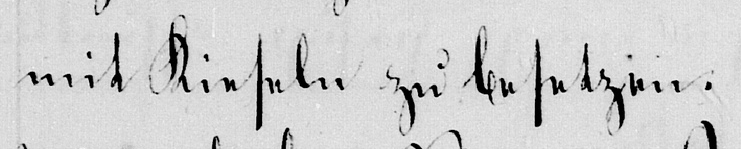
mit Kieseln zu besetzen.
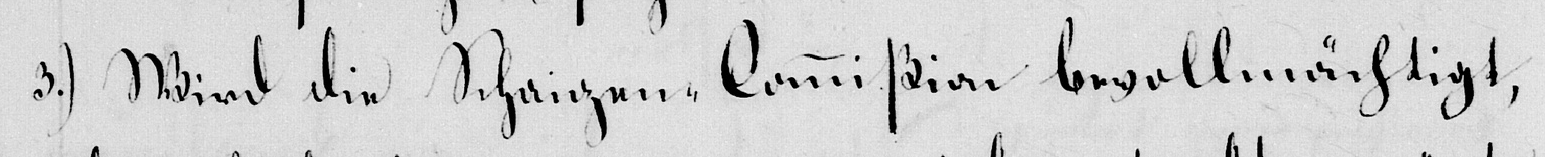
3.) Wird die Schanzen-Commißion bevollmächtigt,
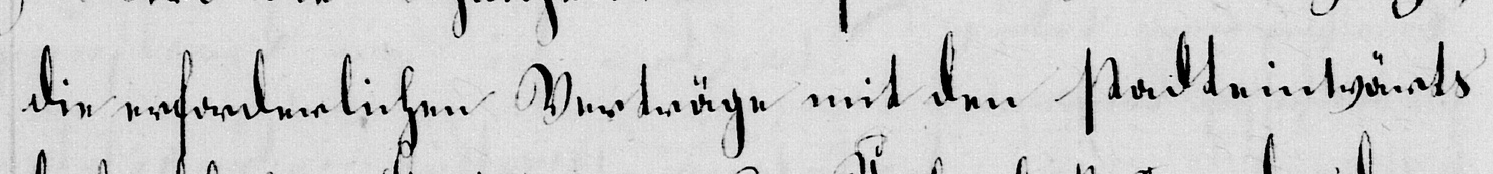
die erforderlichen Verträge mit den stadteinwärts
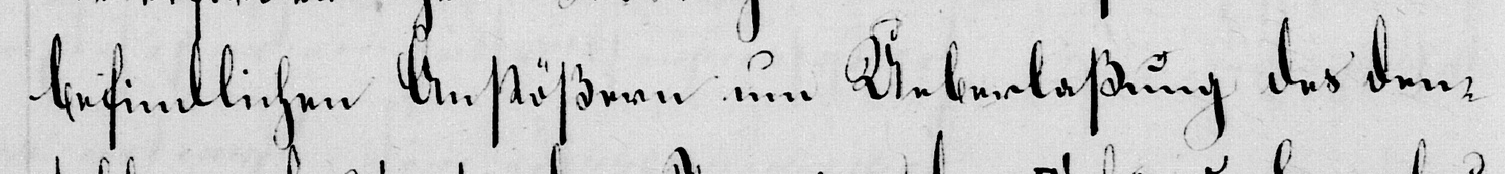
befindlichen Anstößern um Ueberlaßung des den¬
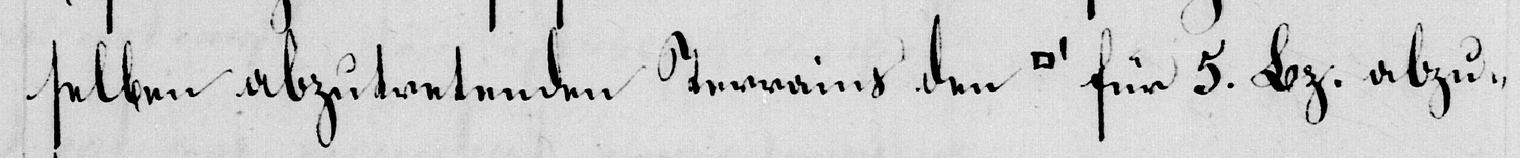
selben abzutretenden Terrains den Quadratfuß für 5. Bz. abzu¬
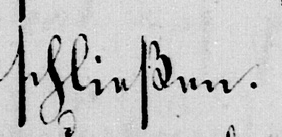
schließen.
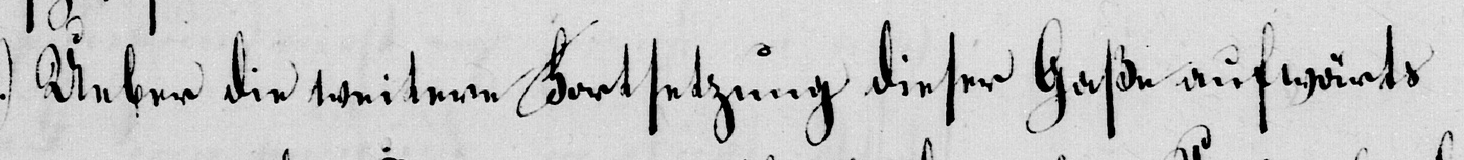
Ueber die weitere Fortsetzung dieser Gaße aufwärts
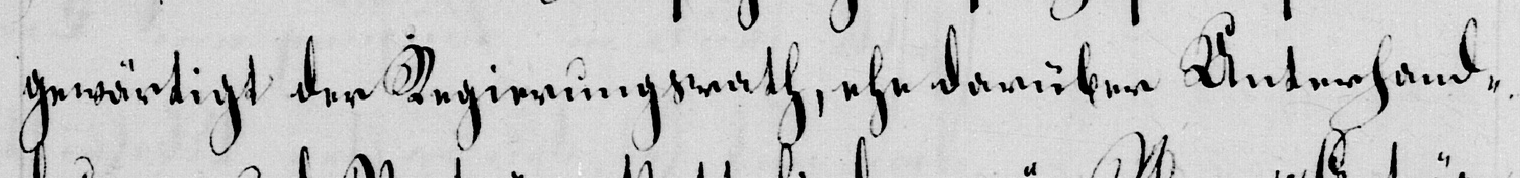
gewärtigt der Regierungsrath, ehe darüber Unterhand¬
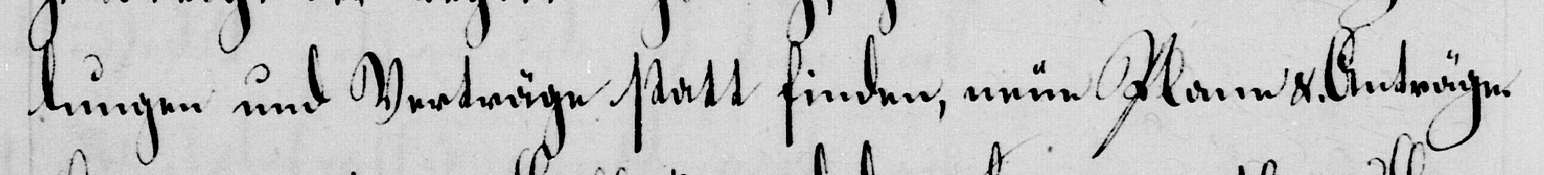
lungen und Verträge statt finden, neue Plane und Anträge.
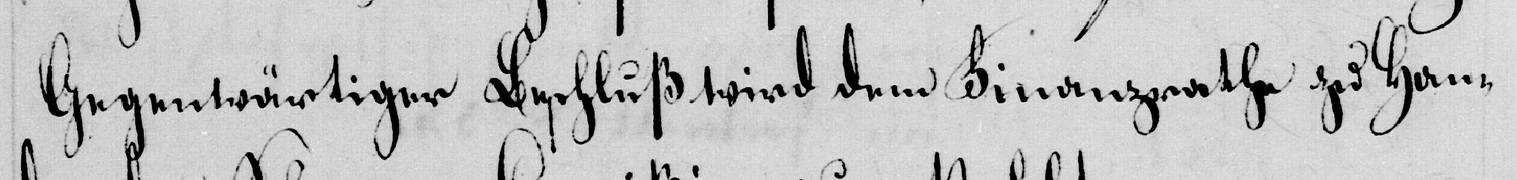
Gegenwärtiger Beschluß wird dem Finanzrathe zu Han¬
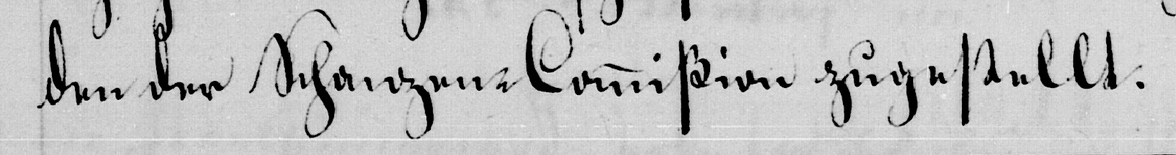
den der Schanzen-Commißion zugestellt.
